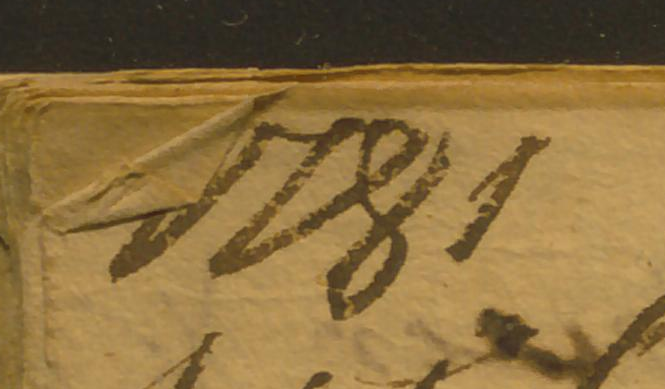1781
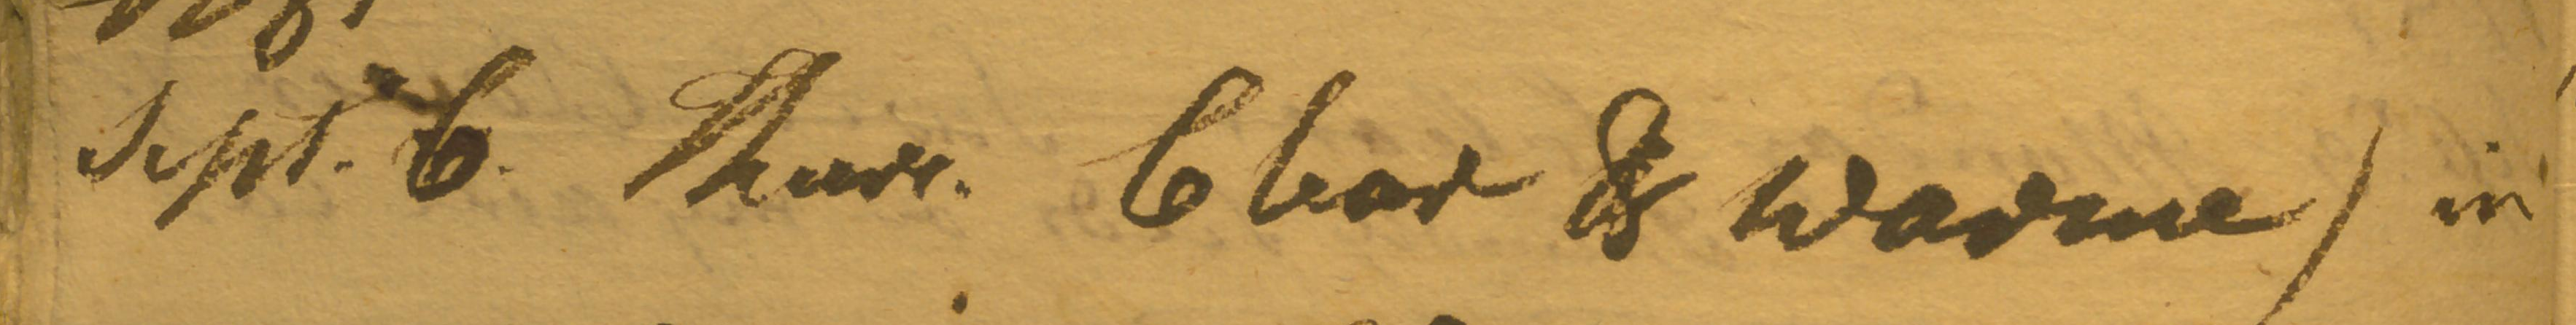Sept^r. 6. Thurs. Clear & warme, in
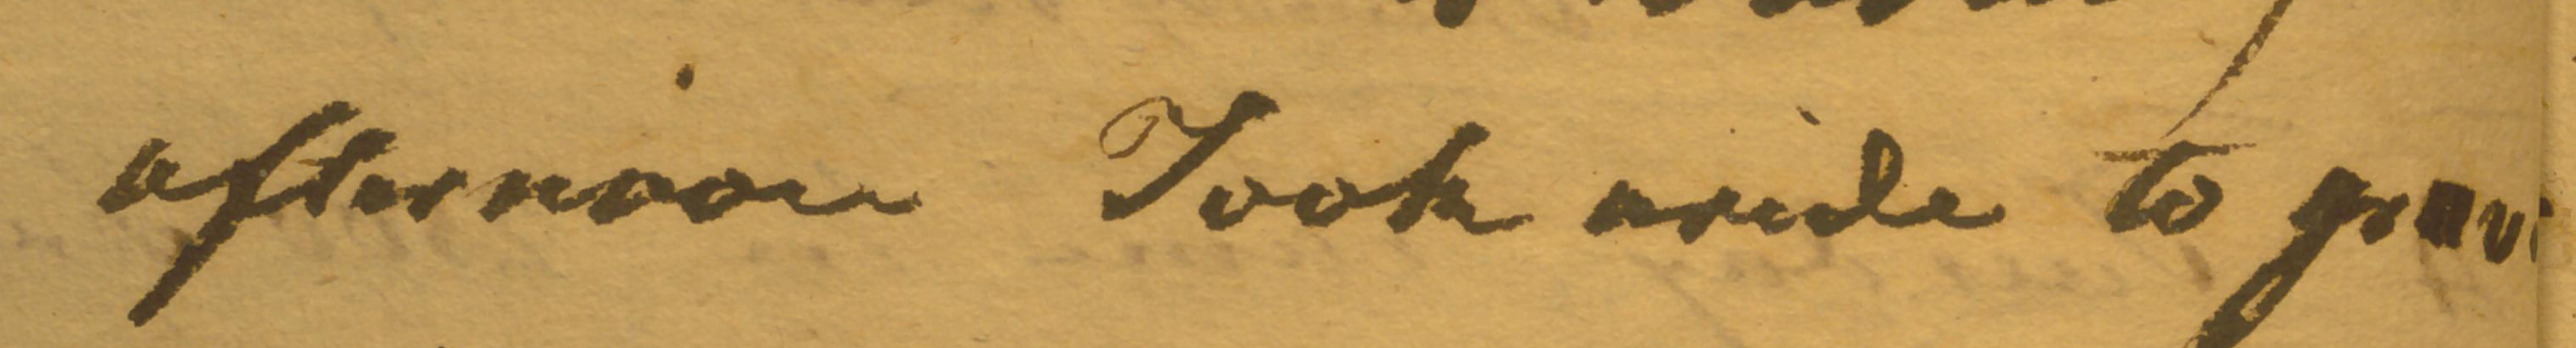afternoon Took a ride to grav
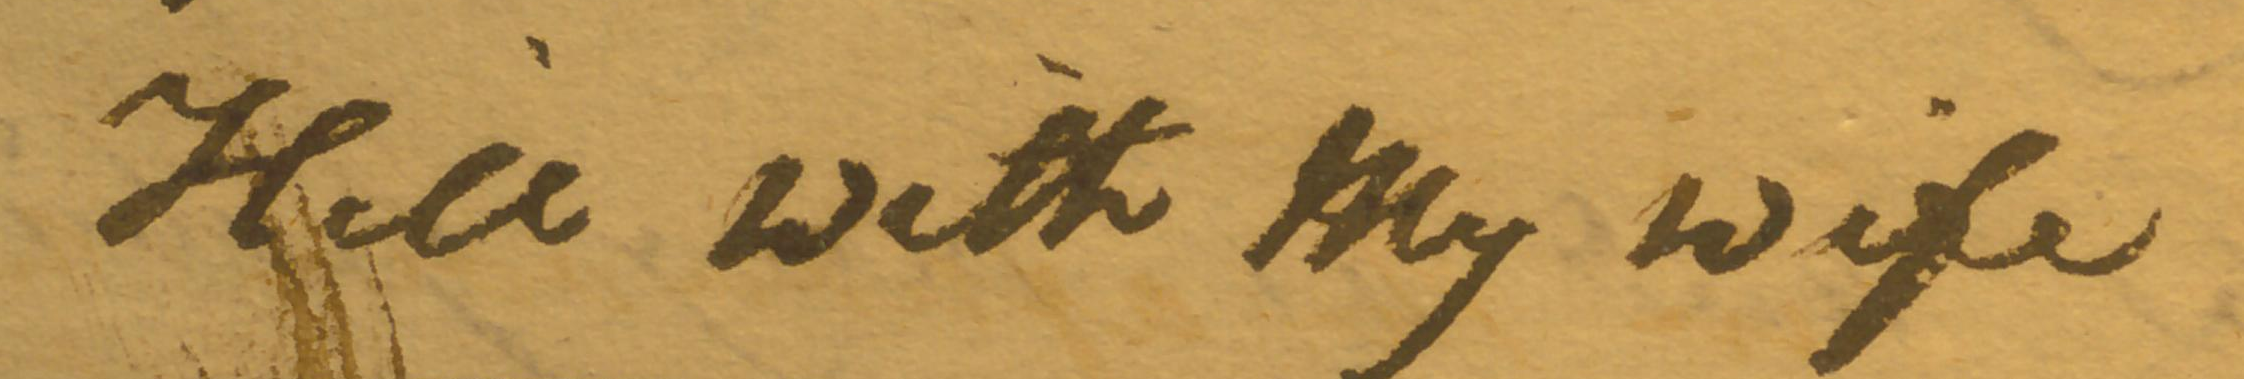Hill with My wife
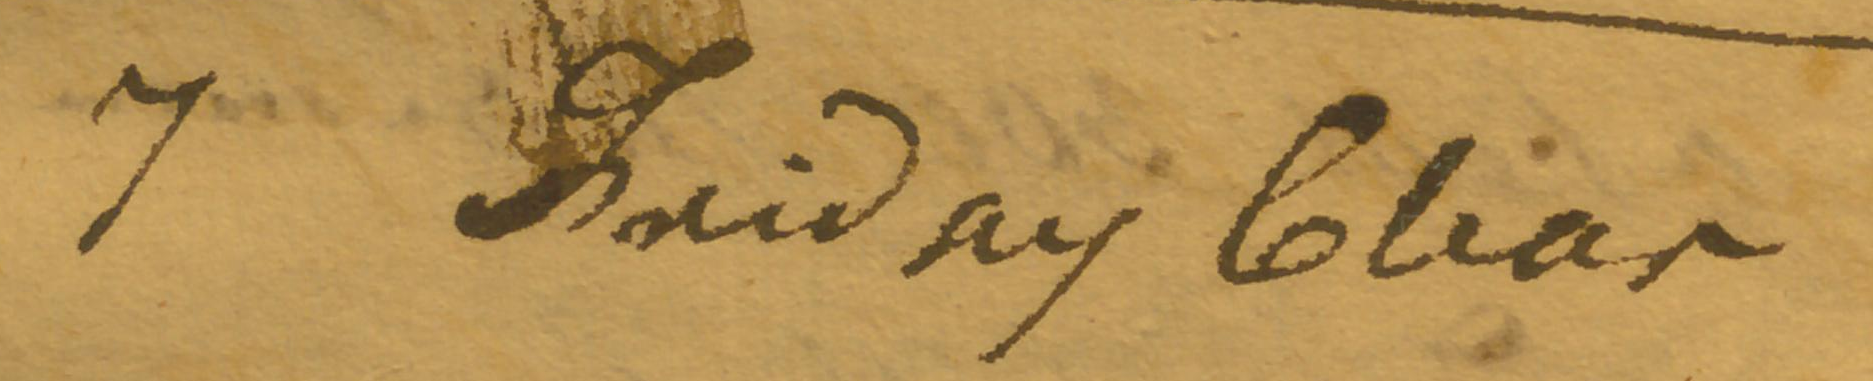7 Friday Clear
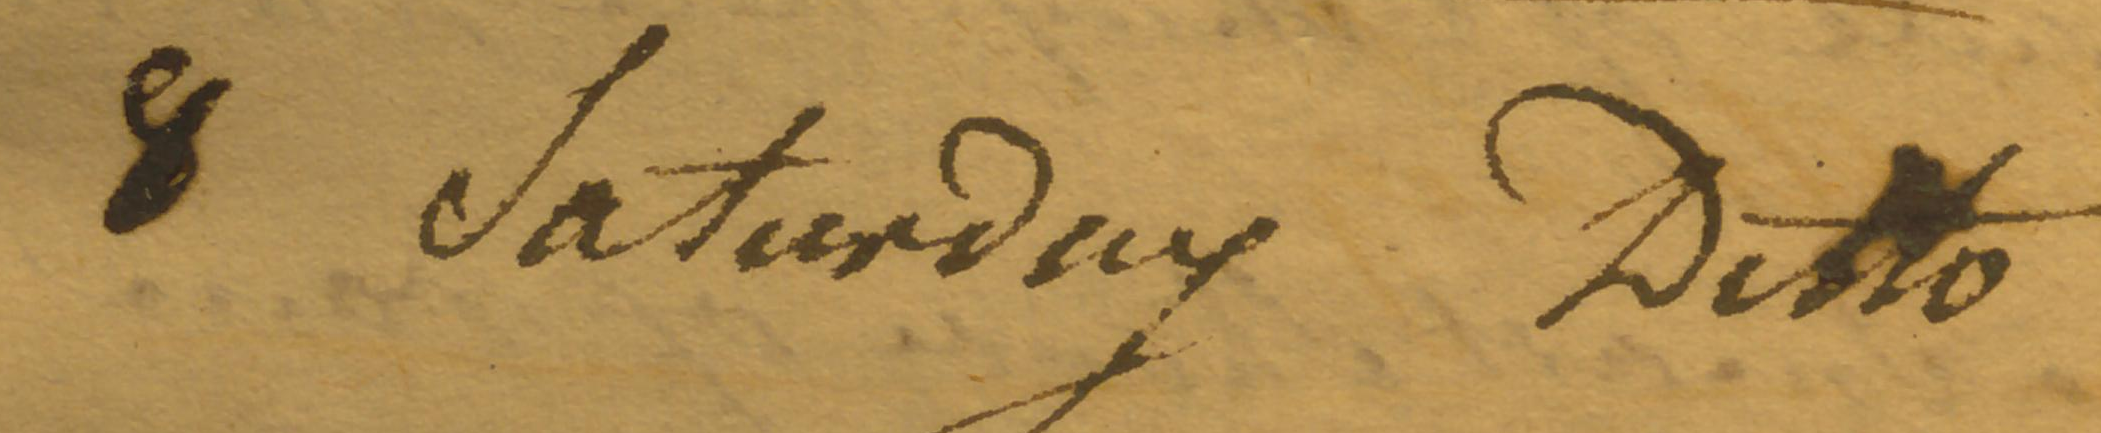8 Saturday Ditto
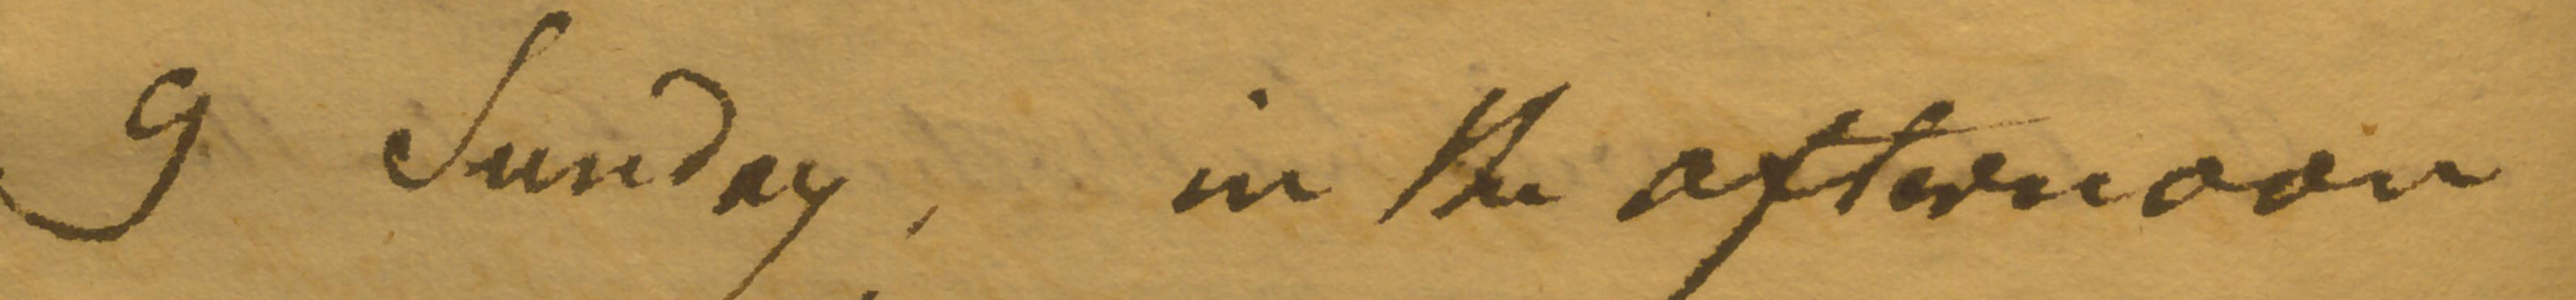9 Sunday, in the afternoon
